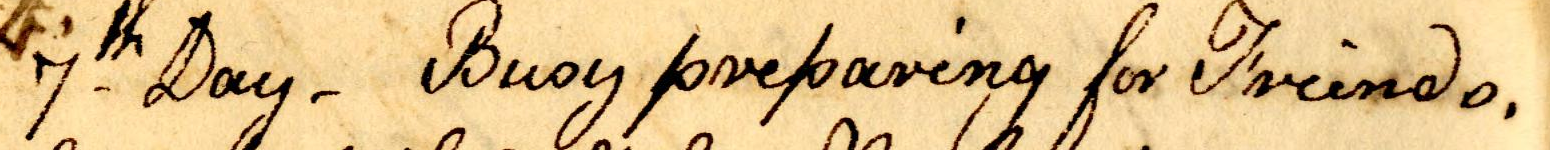7^th Day- Busy preparing for Friends,
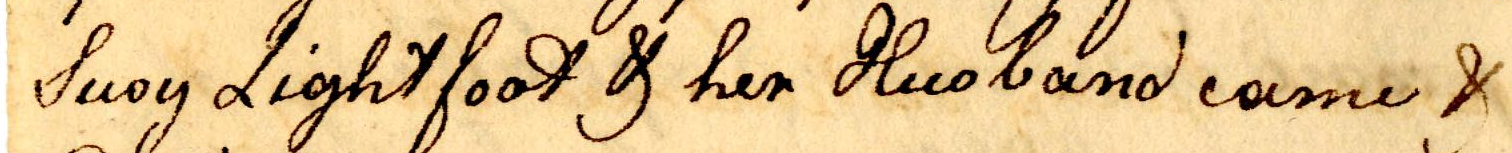Susy Lightfoot & her Husband came &
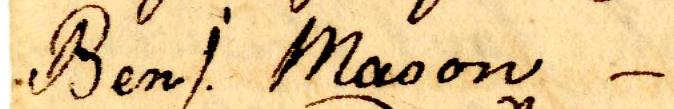Benj. Mason-
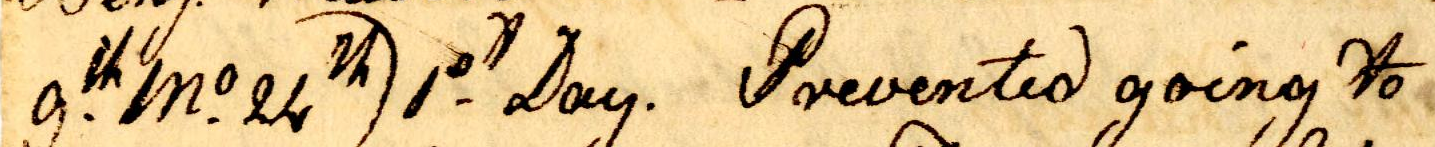9^th. M^o. 24^th) 1^st Day. Prevented going to
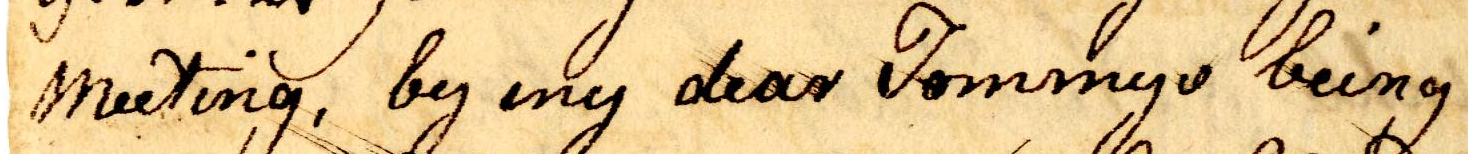Meeting, by my dear Tommys being
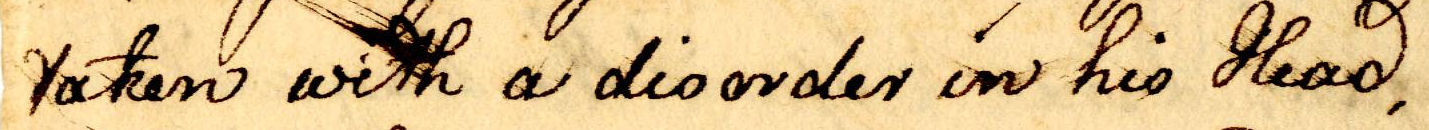taken with a disorder in his Head,
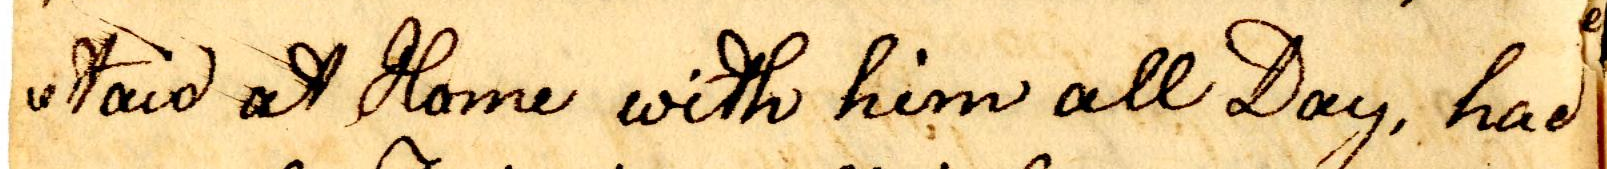staid at Home with him all Day, had
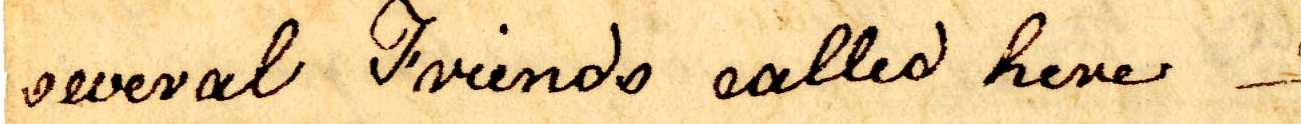several Friends called here-
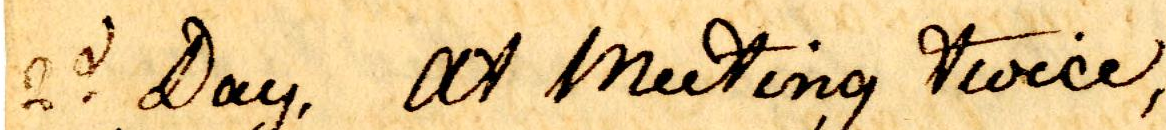2^d. Day. At Meeting twice,
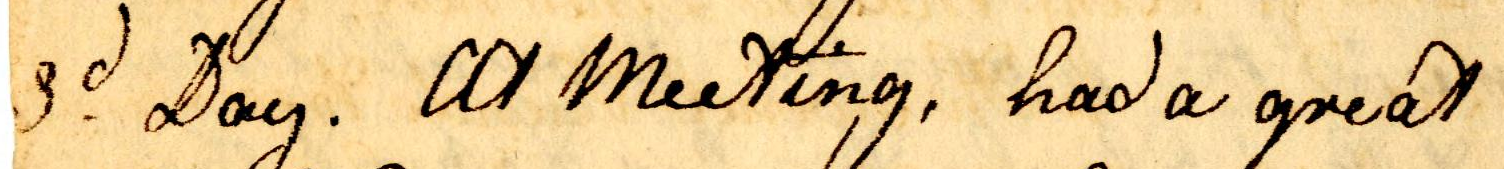3^d. Day. At Meeting, had a great
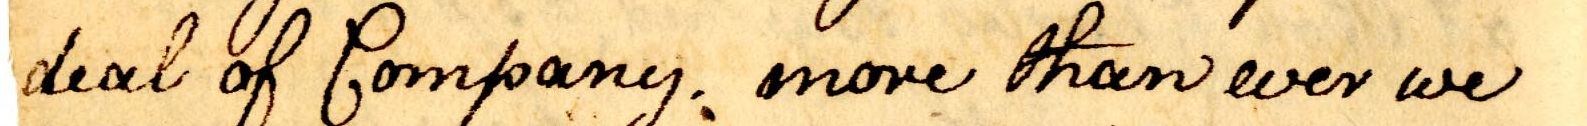deal of Company more than ever we
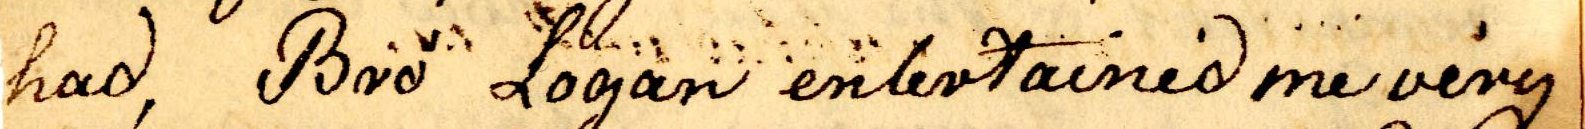had, Bro' Logan entertained me very
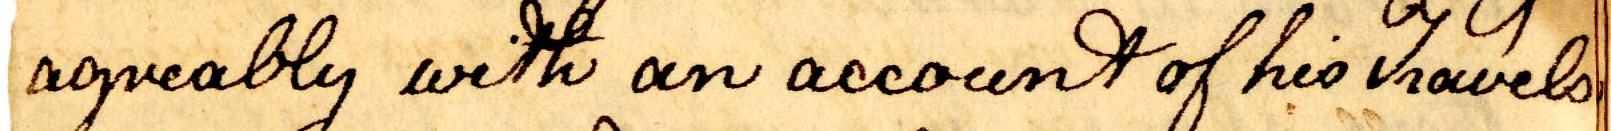agreably with an account of his Travels
